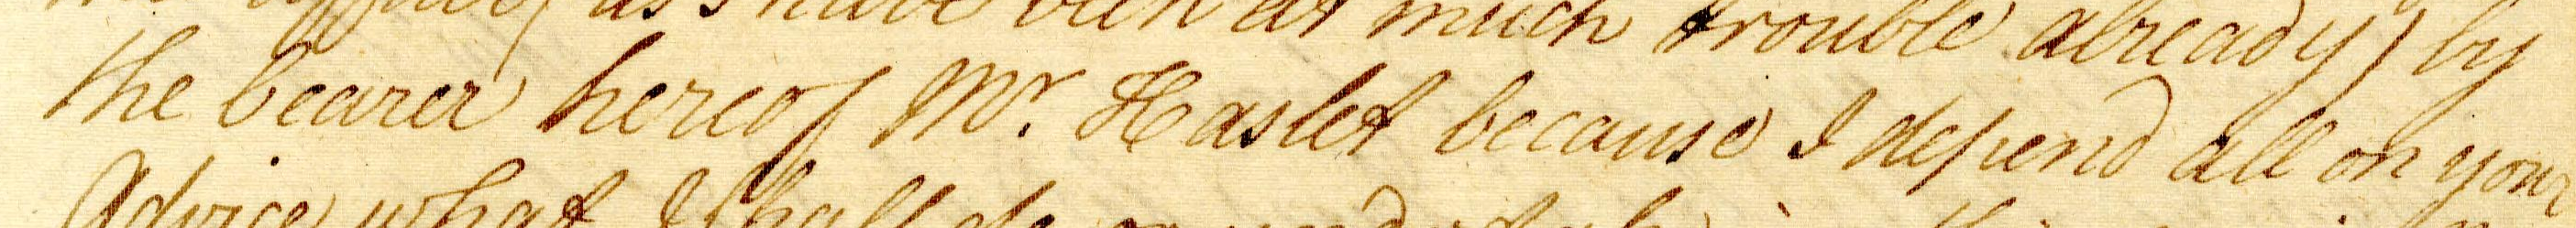the bearer hereof M^r. Haslet because I depend all on you
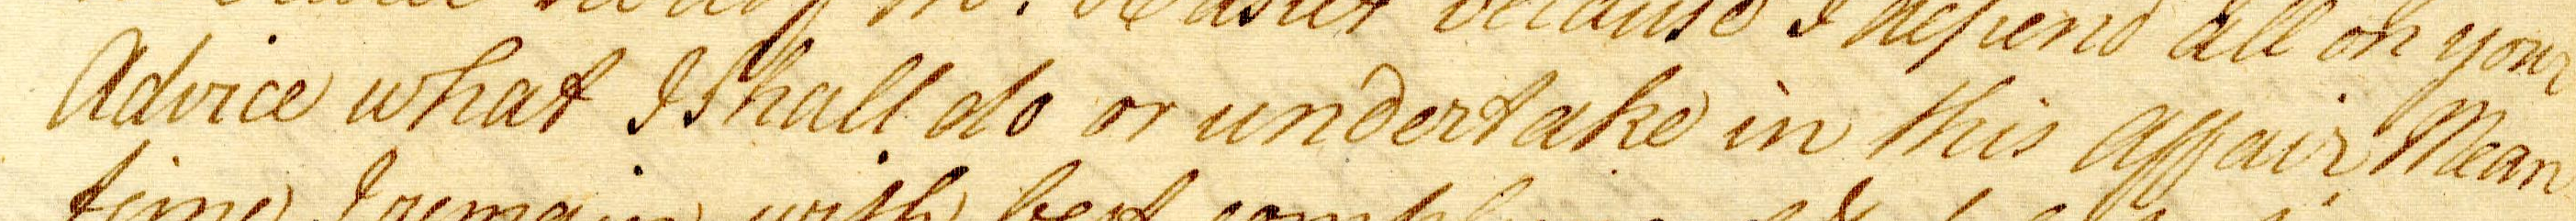Advice what I shall do or undertake in this Affair Mean
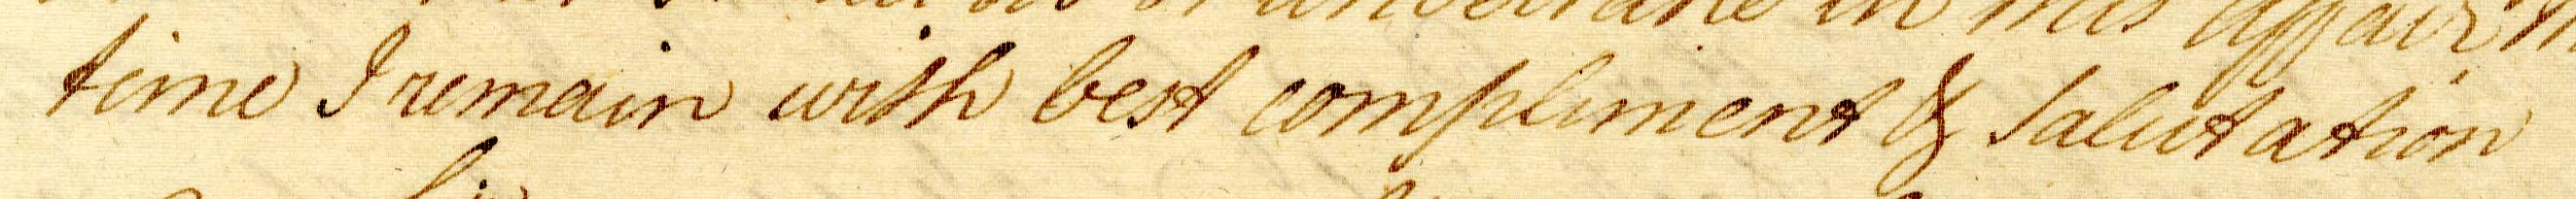time I remain with best compliment & Salutation
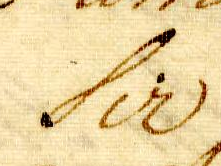Sir
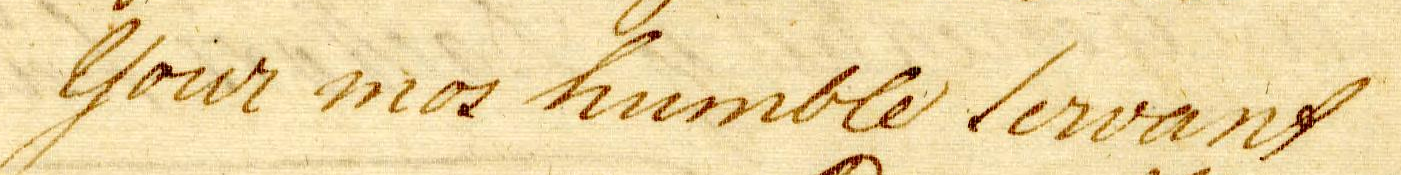Your most humble servant
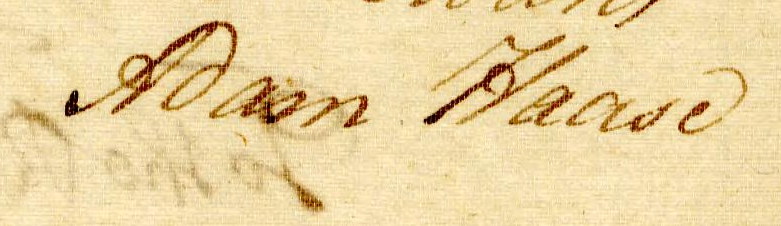Adam Haase
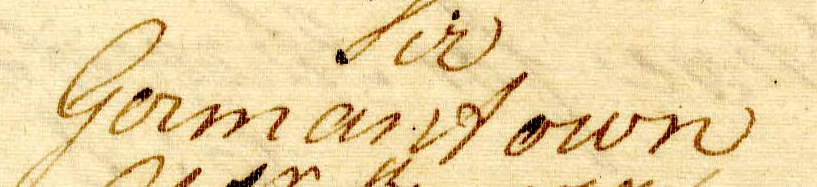Germantown
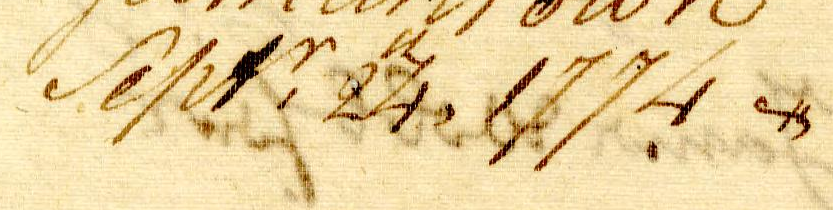Sept^r. 24^th, 1774
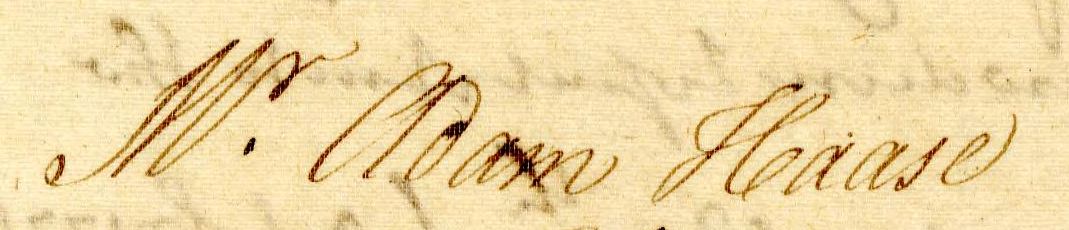M^r. Adam Haase
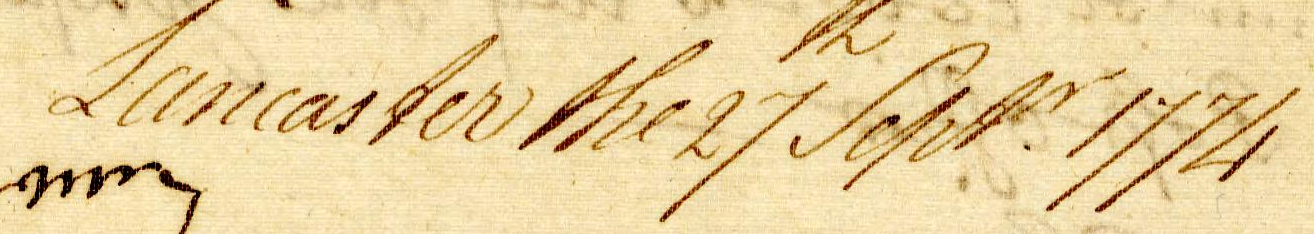Lancaster the 27^th Sept^r. 1774
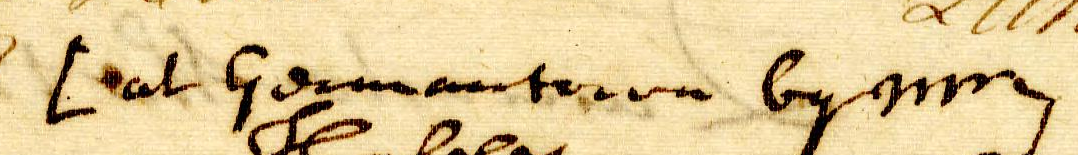(at Germantown by M^r)
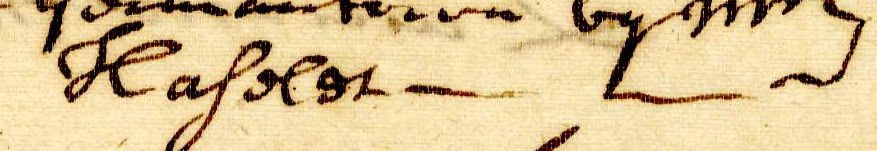Hasselet--
